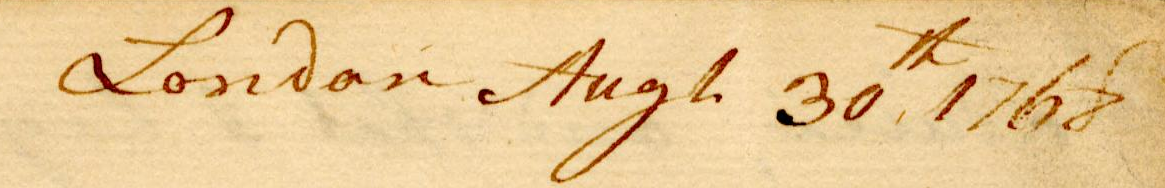London Augt 30^th 1768
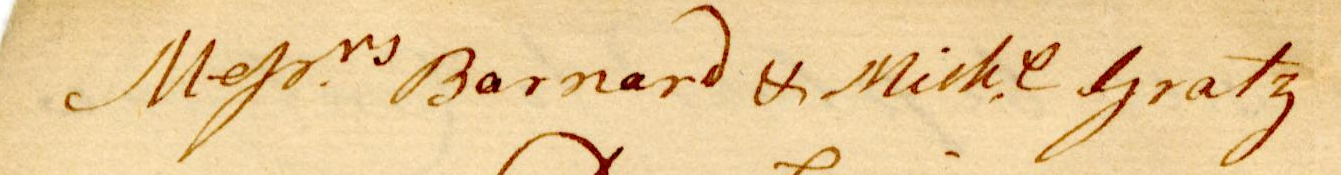Mess^rs. Barnard & Mich^l. Gratz
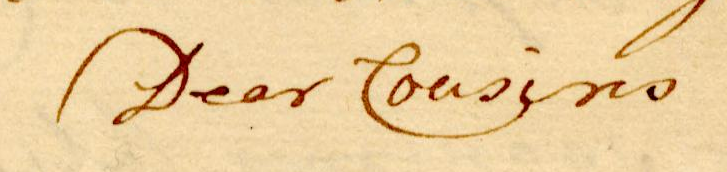Dear Cousins
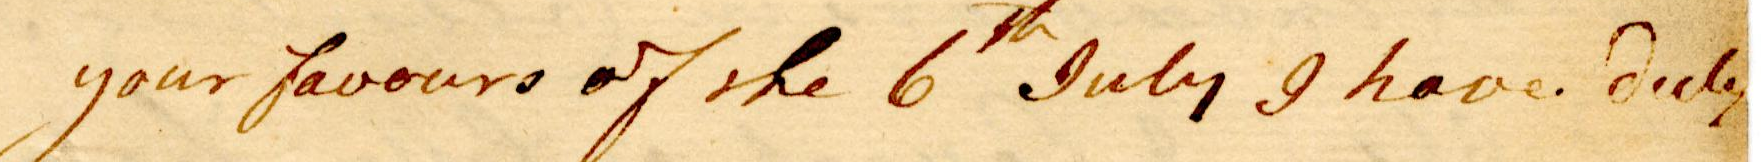your favours of the 6^th July I have. duly
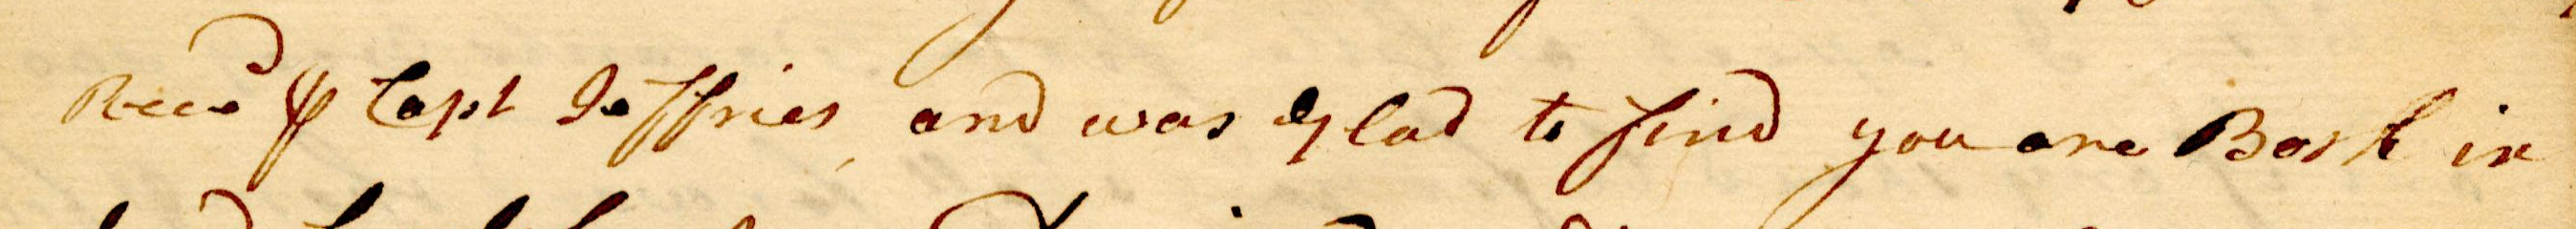rece^d per Capt Jeffries and was Glad to find you one Both in
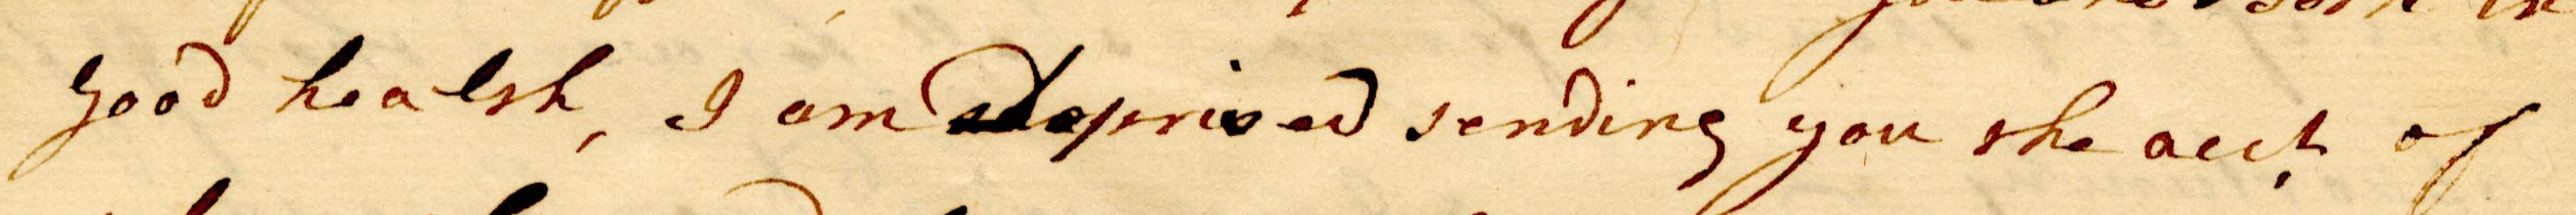good health, I am deprived sending you the acc^t of
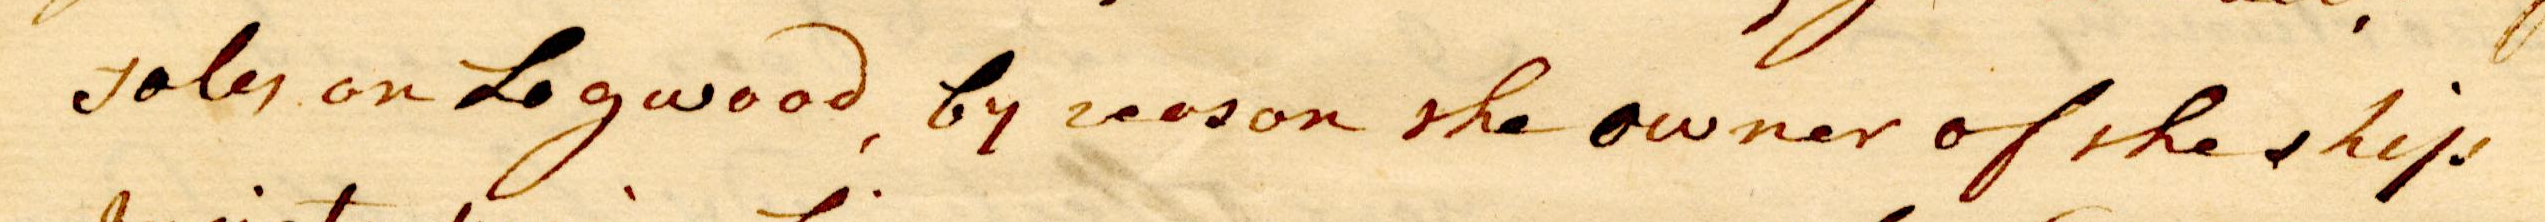sales on Logwood, by reason the owner of the ship
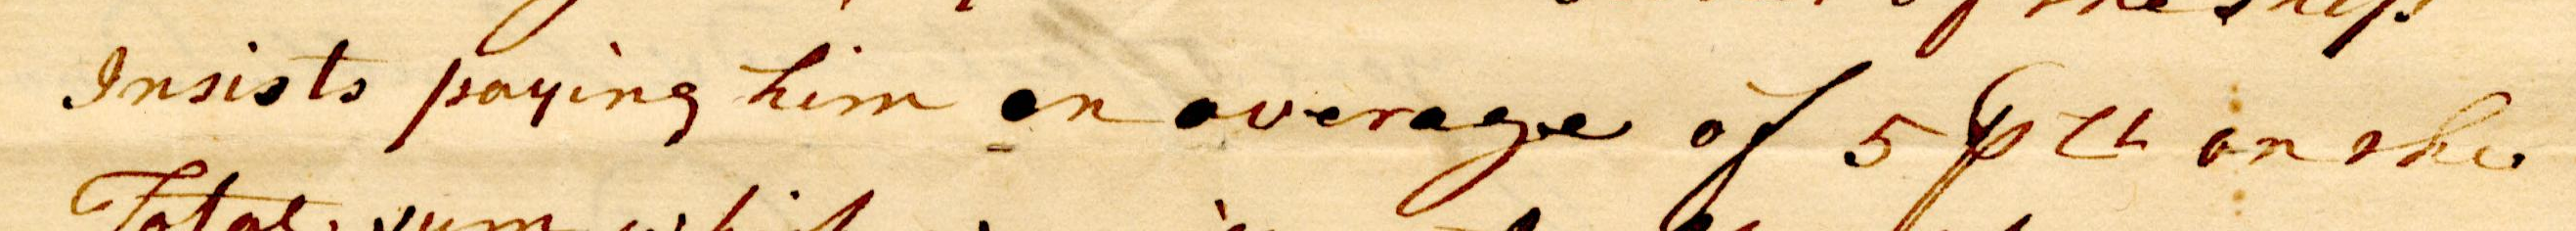Insists paying him on average of 5 per C^t on the
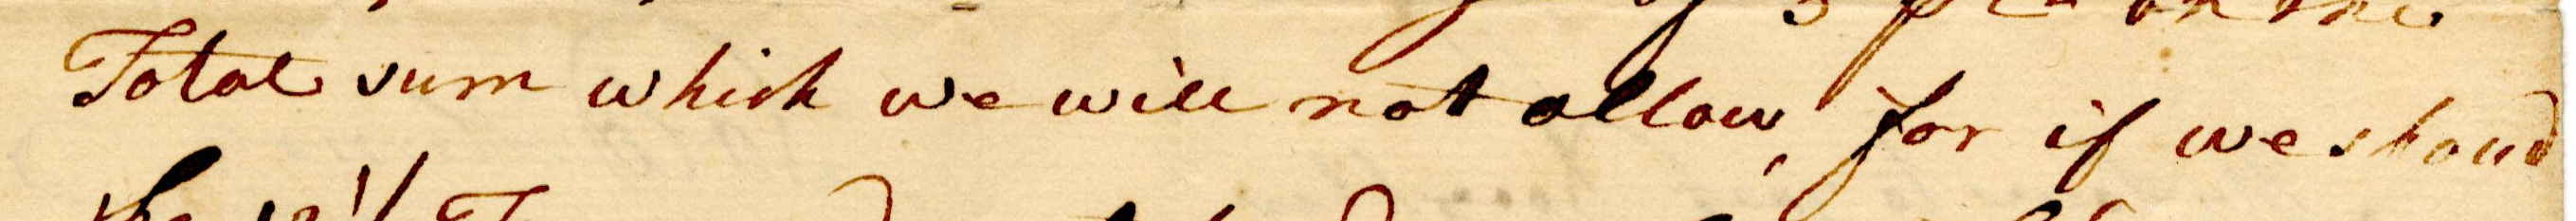Total sum which we will not allow, for if we shoud
